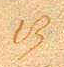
13
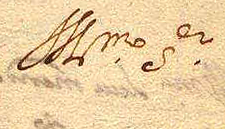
Illm.o Sor.
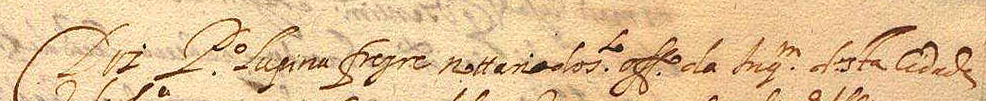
Diz P.o lupina freyre nottario do s.to off.o da Inq.m desta Cidade
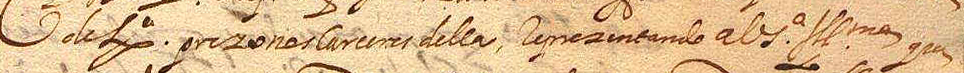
de Lxa. prezo nos carceres della, Reprezentando a V s.a Jll.ma que
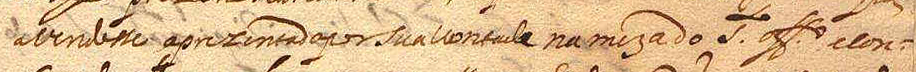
avendosse aprezentado por sua uontade na meza do s.to off.o e con
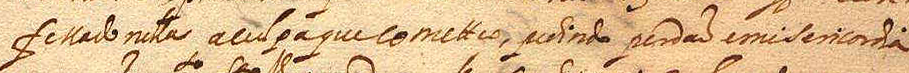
fessado nella a culpa que cometteo, pedindo perdaõ e misericordia
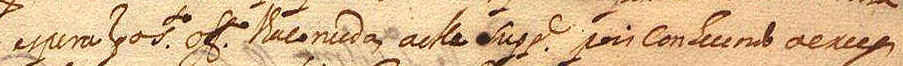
espera q̄ o s.to off.o lha conceda, a elle supp.e pois conhecendo o exces
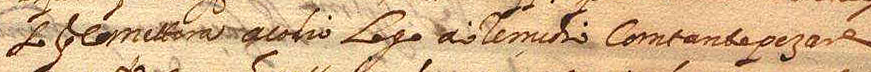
so q̄ comettera acodio Logo ao Remedio com tanto pezar
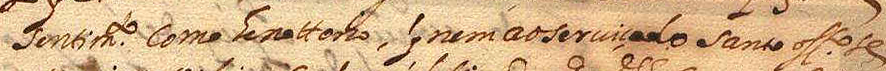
sentim.to como he nottorio, q̄ nem ao seruiço do santo off.o se
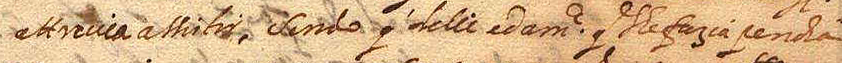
attreuia assistir, sendo q̄ delle e da mce. q̄ lhe fazia pendia
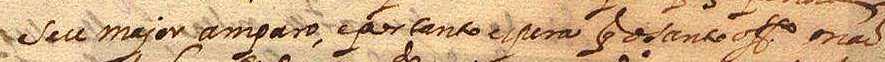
seu major amparo, e portanto espera q̄ o santo off.o o naõ
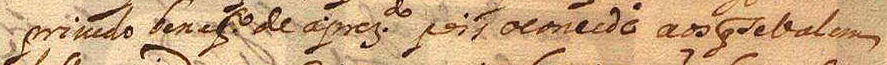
priue do benef.o de aprez.do pois o concede aos q̄ se valem
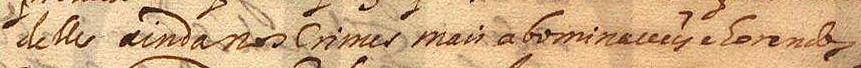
delle ainda nos Crimes mais abominaueis e horendos.
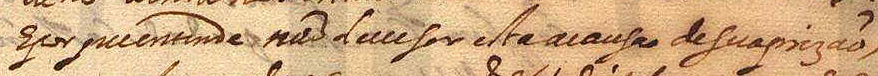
E porque entende naõ deue ser esta a causa de sua prizaõ,
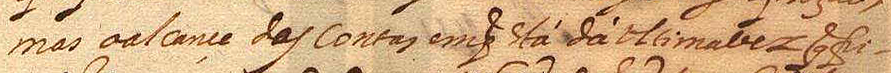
mas o alcance das contas em q̄ está da vltima vez q̄ foi
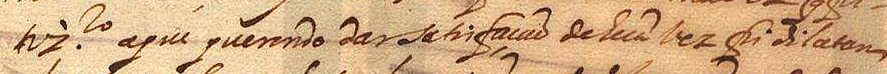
tiz.ro a que querendo dar satisfaçaõ de huā vez foi dilatan
